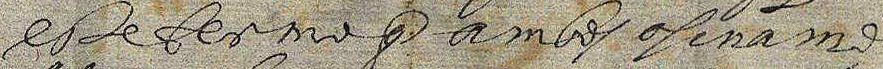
este termo q̄ ambos asinamos
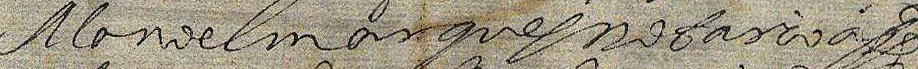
Manoel marques notario appco
